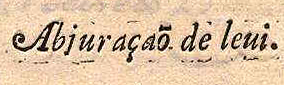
Abjuraçaõ de leui.
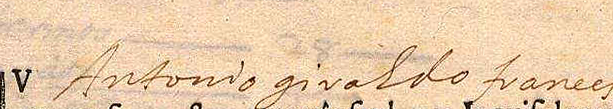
V Antonio giraldo frances
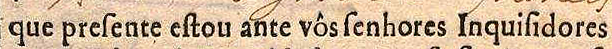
que presente estou ante vôs senhores Inquisidores
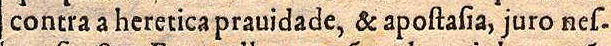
contra a heretica prauidade, & apostasia, juro nes
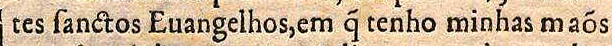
tes sanctos Euangelhos, em q̄ tenho minhas maõs
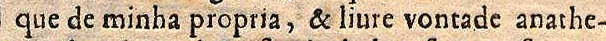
que de minha propria, & liure vontade anathe
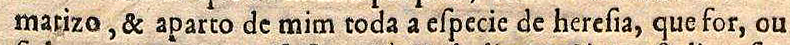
matizo, & aparto de mim toda a especie de heresia, que for, ou
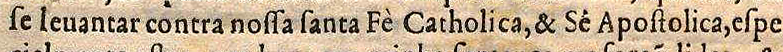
se leuantar contra nossa santa Fè Catholica, & Sé Apostolica, espe
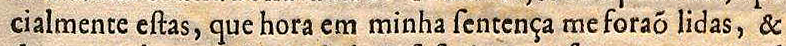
cialmente estas, que hora em minha sentença me foraõ lidas, &
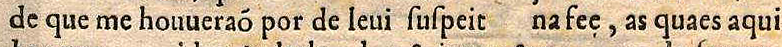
de que me houueraõ por de leui suspeit na fee, as quaes aqui
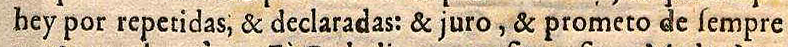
hey por repetidas, & declaradas: & juro, & prometo de sempre
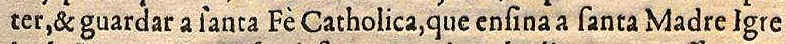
ter, & guardar a santa Fè Catholica, que ensina a santa Madre Igre
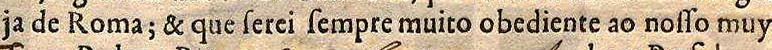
ja de Roma; & que serei sempre muito obediente ao nosso muy
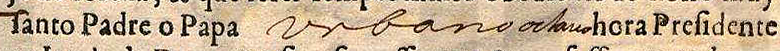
santo Padre o Papa Vrbano octauo hora Presidente
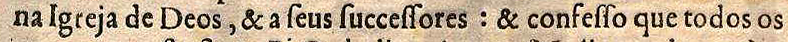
na Igreja de Deos, & a seus successores: & confesso que todos os
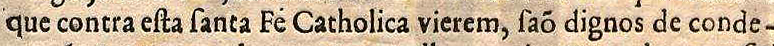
que contra esta santa Fè Catholica vierem, saõ dignos de conde
